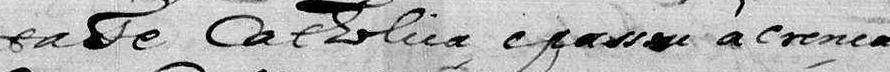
ta Fe Catholica, e passou à crença
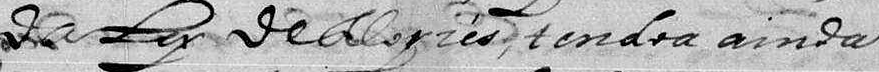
da Ley de Moyzés, tendoa ainda
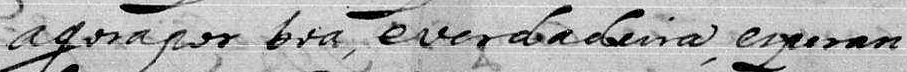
agora por boa, e verdadeira, esperan
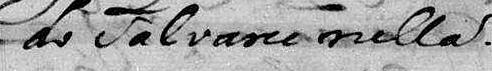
do salvarce nella.
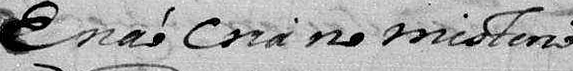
E naõ cria no misterio
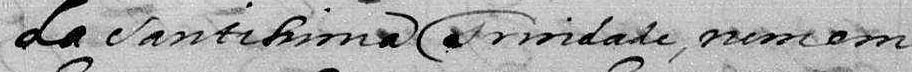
da santissima Trindade, nem em
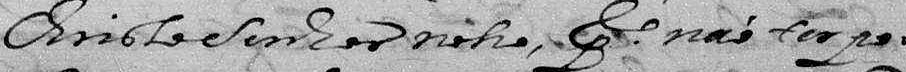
christo senhor nosso, p.lo naõ ter por
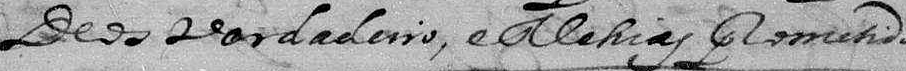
Deos verdadeiro, e Messias prometido
